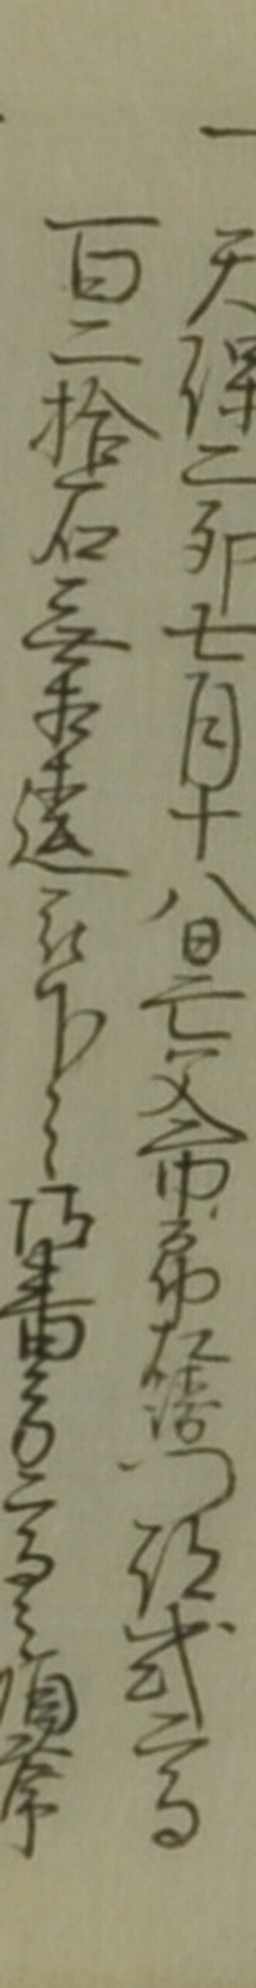百二拾石無相違被下之御番方高之順
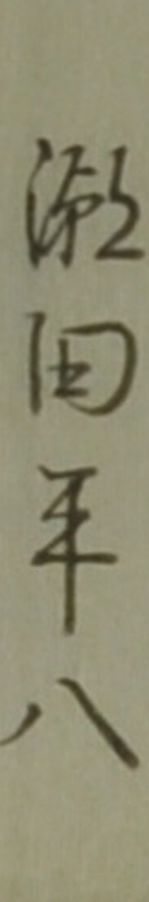潮田平八
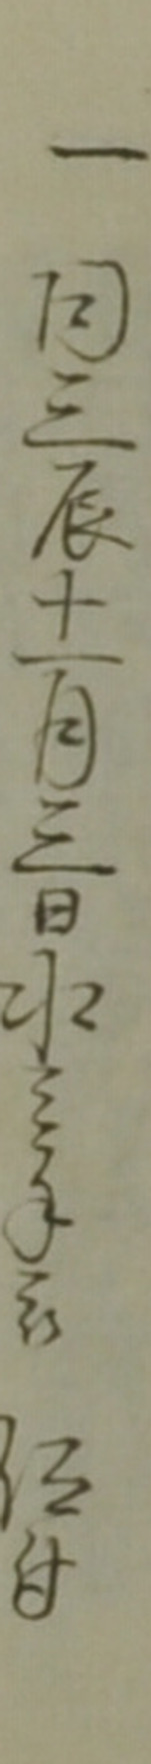一同三辰十一月三日水之手被仰付
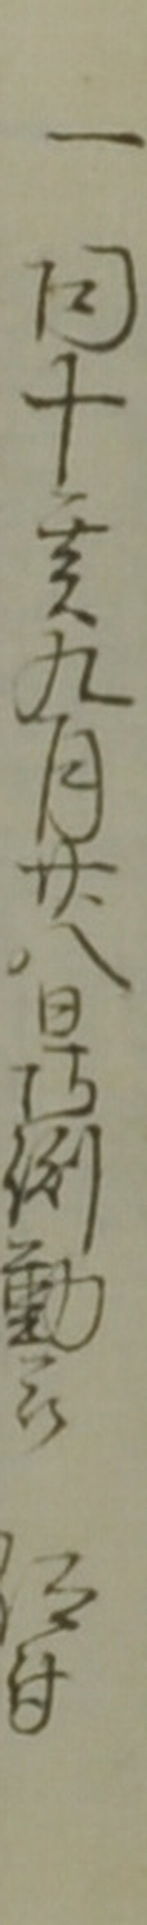一同十亥九月廿八日御側勤被仰付
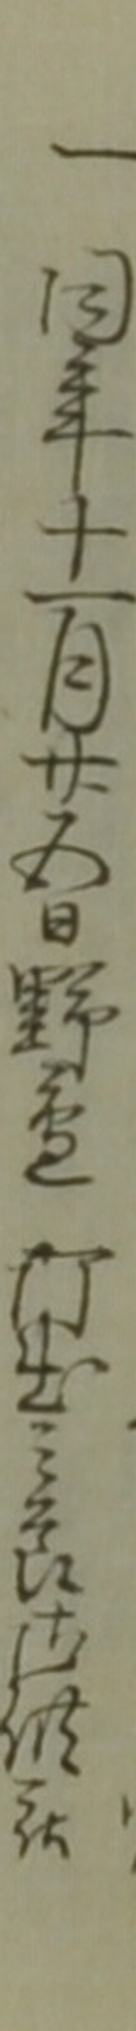一同年十一月廿五日野辺御出之節御供被
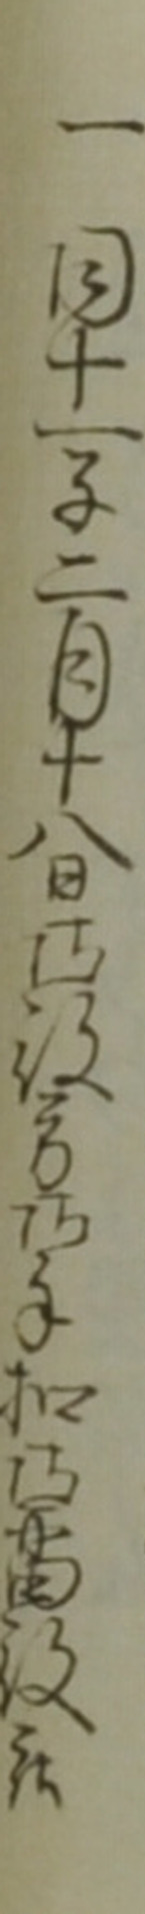一同十一子二月十八日御役方御手控御番役被
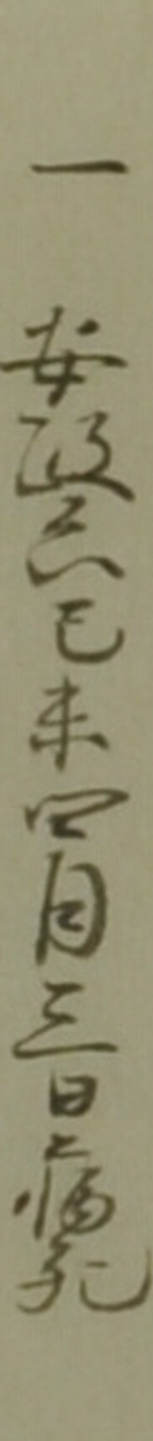一安政六己未四月三日病死

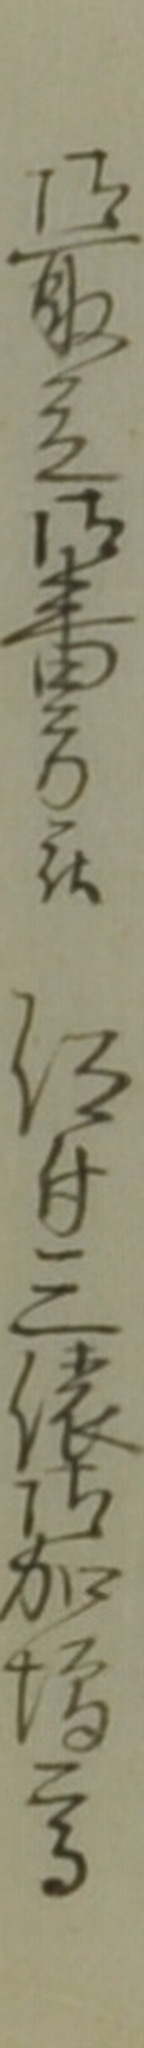御取立御番方被仰付三俵御加増高
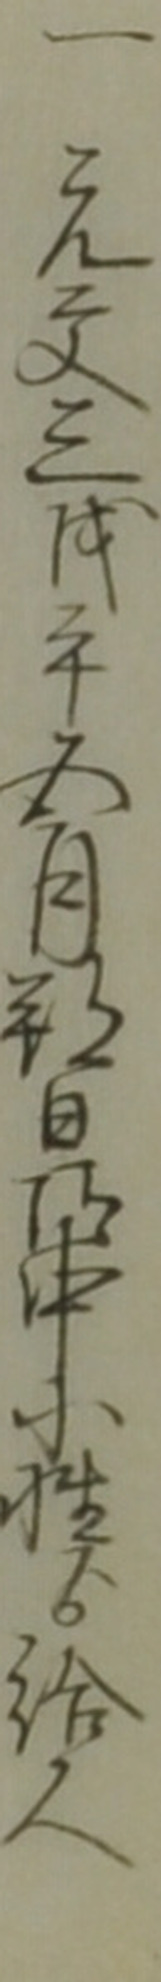一元文三戊五月朔日御中小性ゟ給人
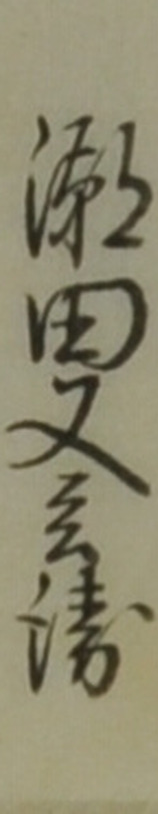潮田又兵衛
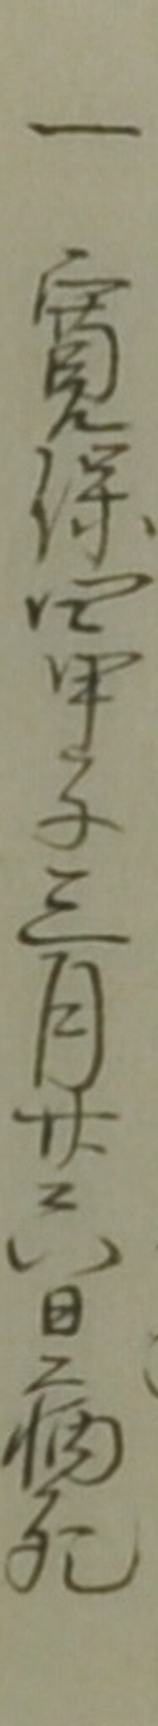一寛保四甲子三月廿六日病死
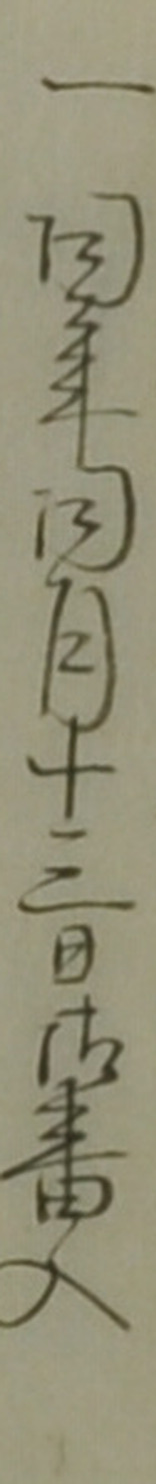一同年同月十三日御番入
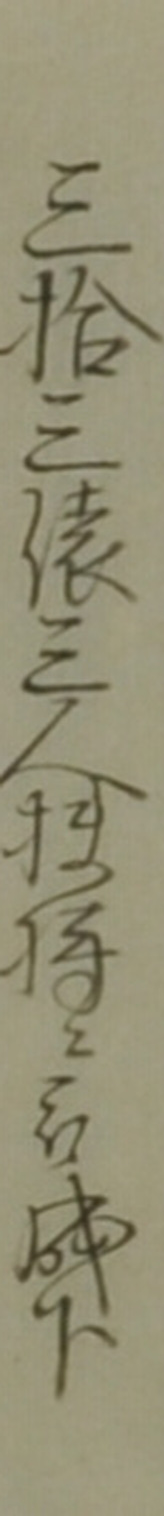三拾三俵三人扶持ニ被成下
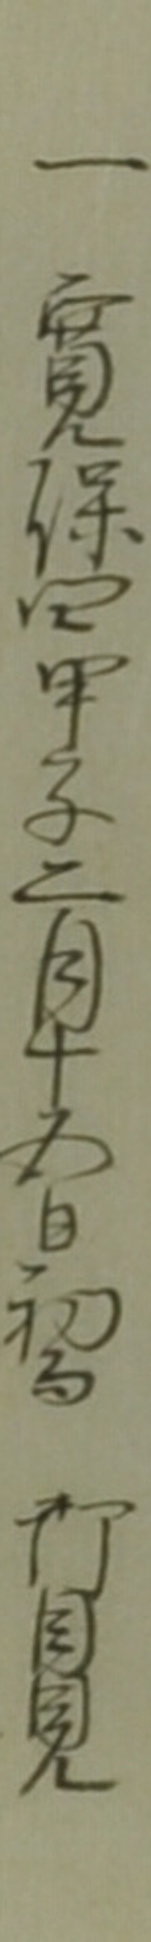一寛保四甲子二月十五日初而御目見
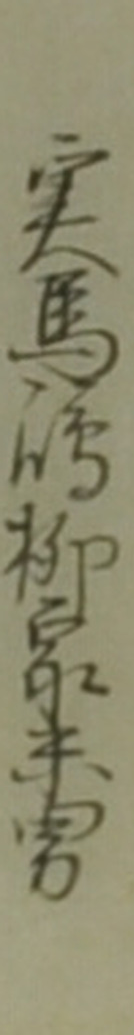実馬嶋柳家末男
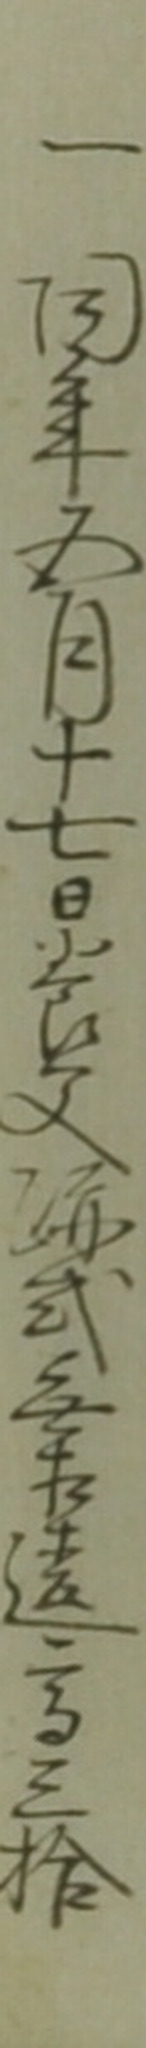一同年五月十七日養父跡式無相違高三拾
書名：給人諸士勤仕録（三）
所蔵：伊那市立高遠町図書館・合同会社AMANE
